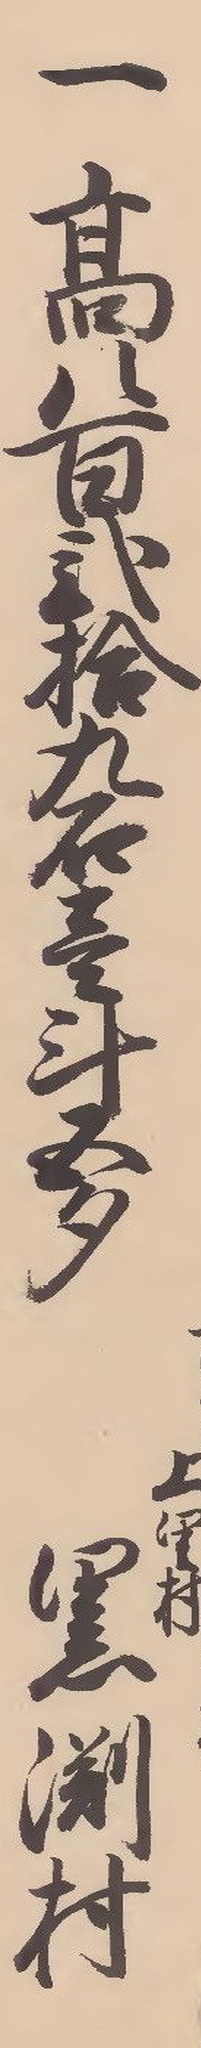一高八百弐拾九石壱斗五勺黒淵村
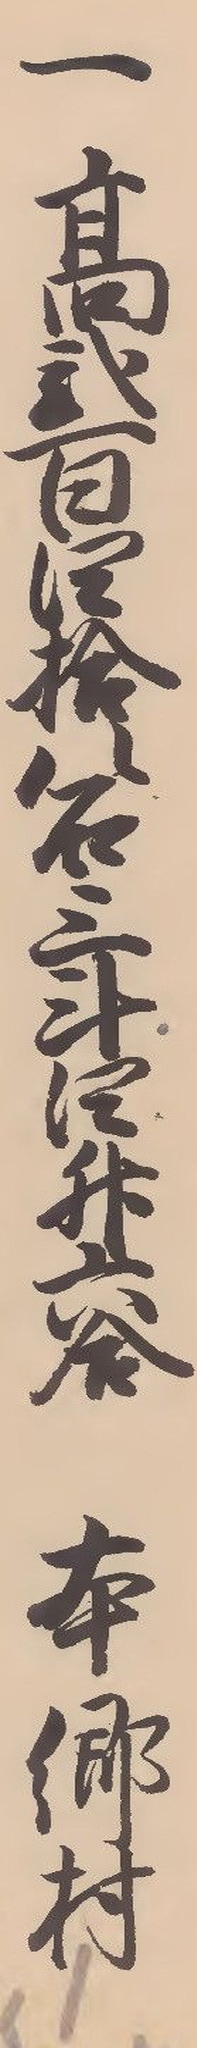一高弐百四拾八石三斗四升六合本郷村
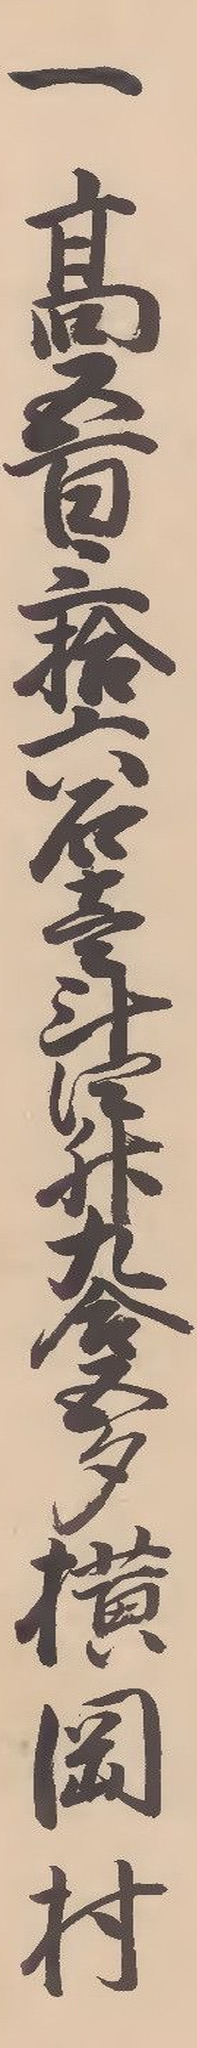一高五百三拾六石壱斗四升九合五勺横岡村

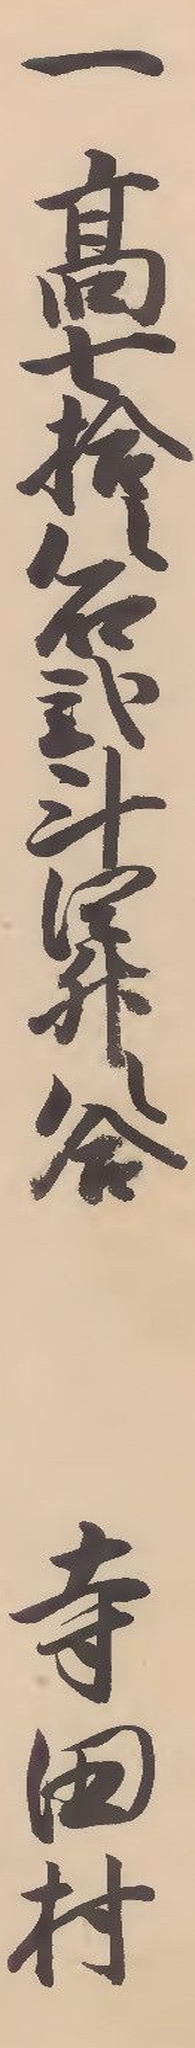一高七拾八石弐斗四升八合寺田村
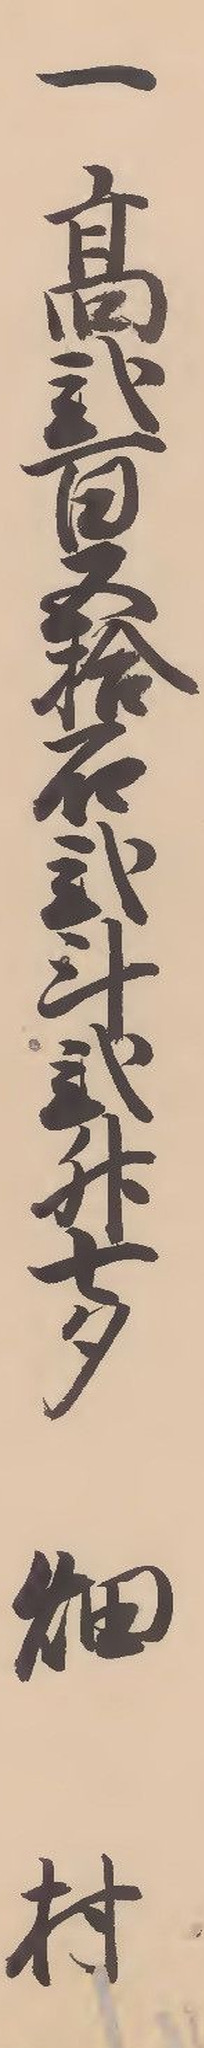一高弐百五拾石弐斗弐升七勺畑村
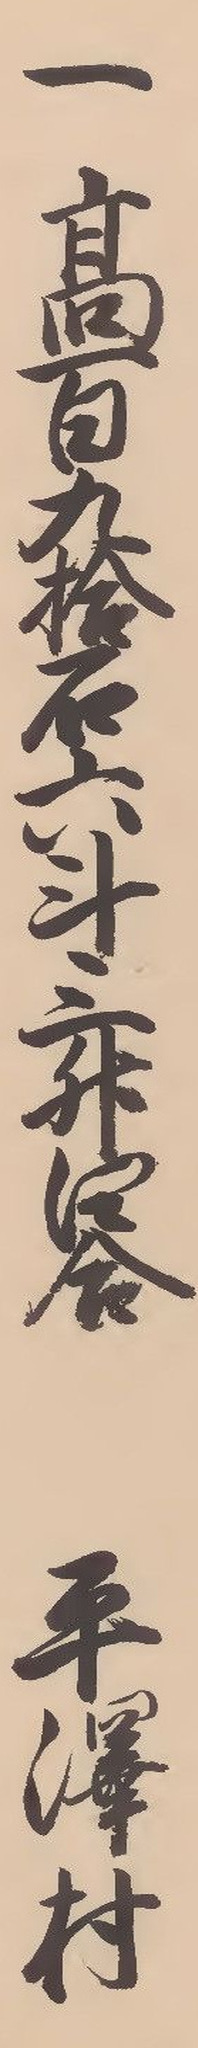一高百九拾石六斗三升四合平沢村
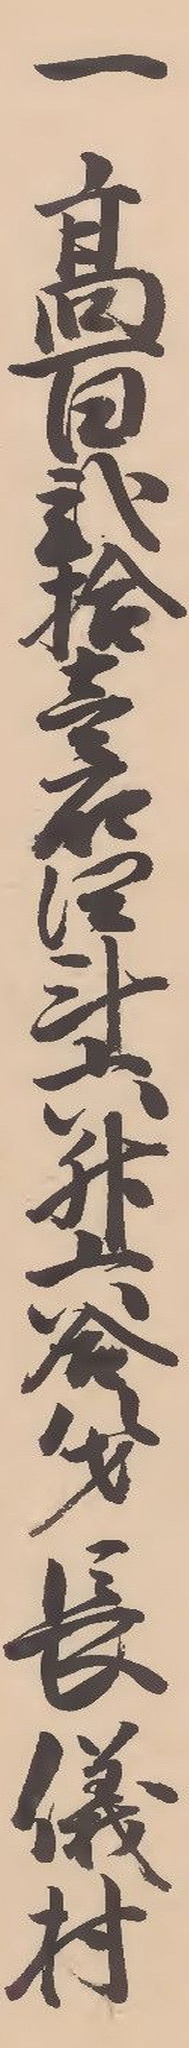一高百弐拾壱石四斗六升六合八才長儀村
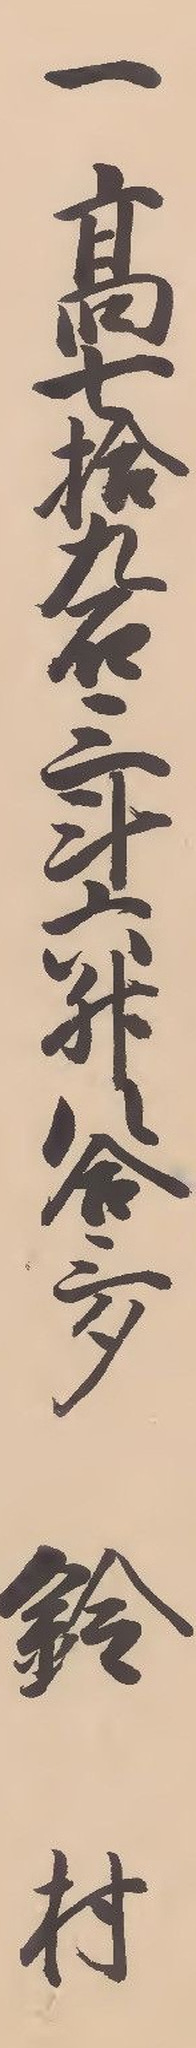一高七拾九石三斗六升八合三勺鈴村
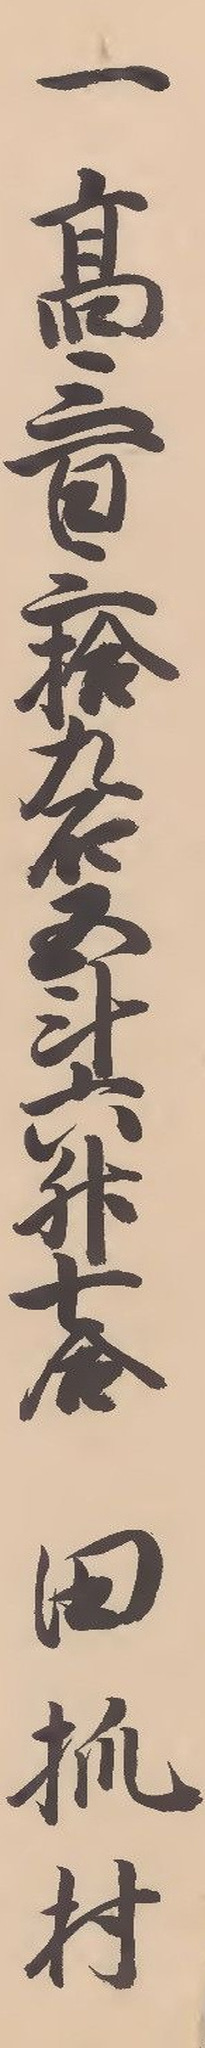一高三百三拾九石五斗六升七合田抓村
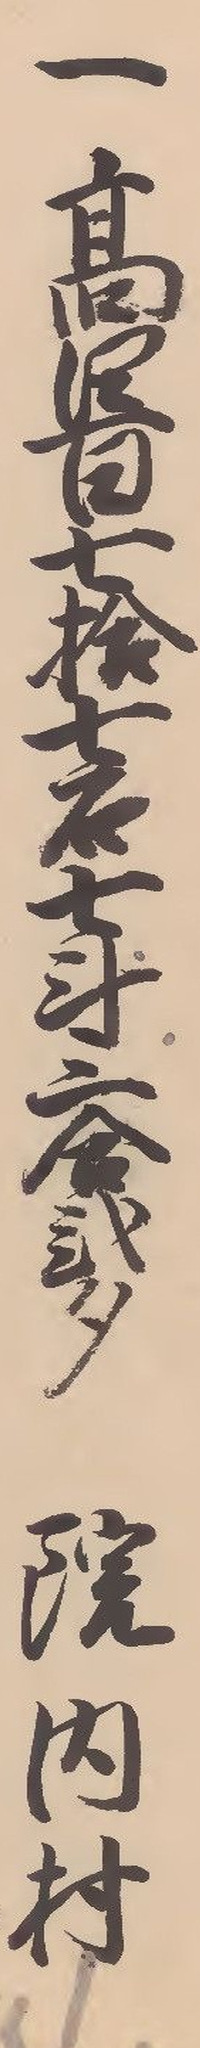一高四百七拾七石七斗弐合弐勺院内村
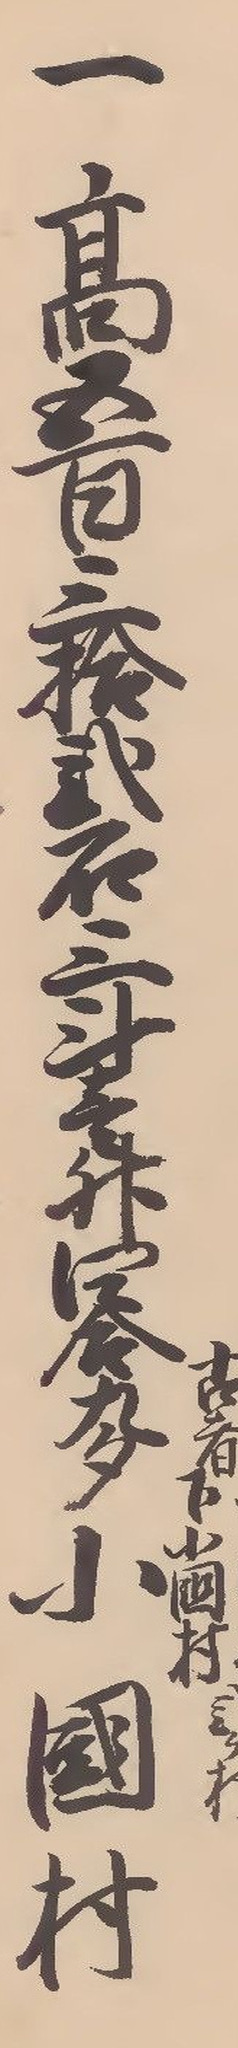一高五百三拾弐石三斗壱升四合九勺小国村

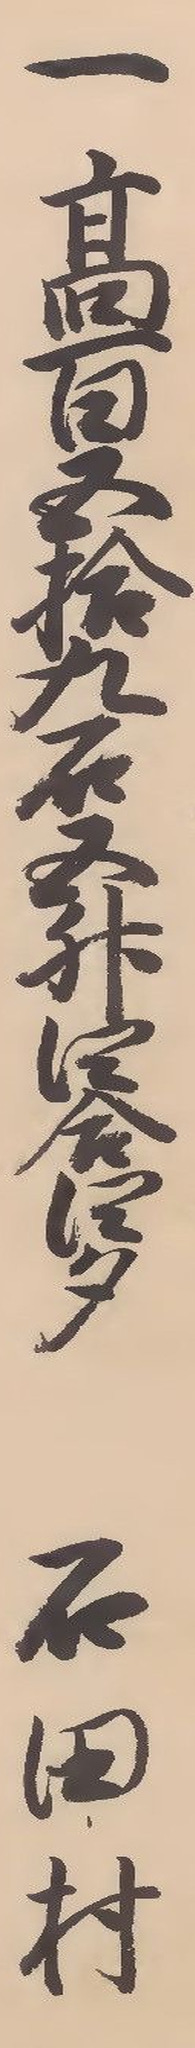一高百五拾九石五升四合四勺石田村
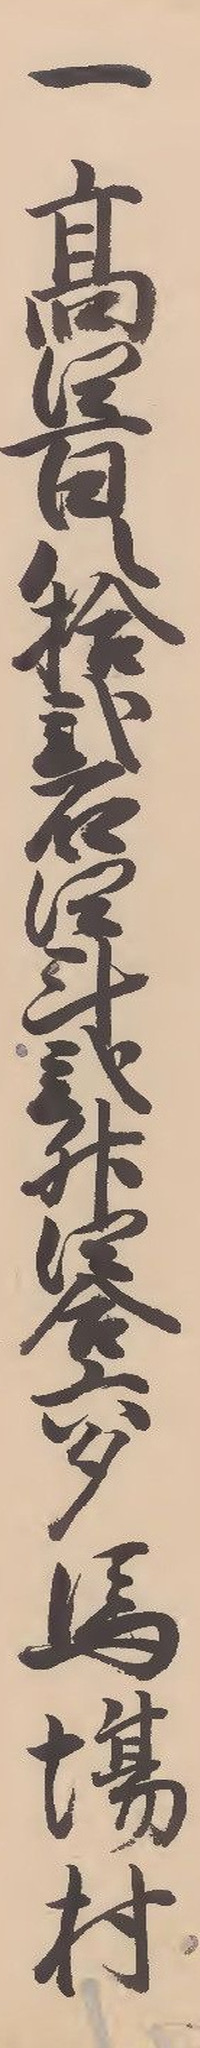一高四百八拾弐石四斗弐升四合六勺馬場村
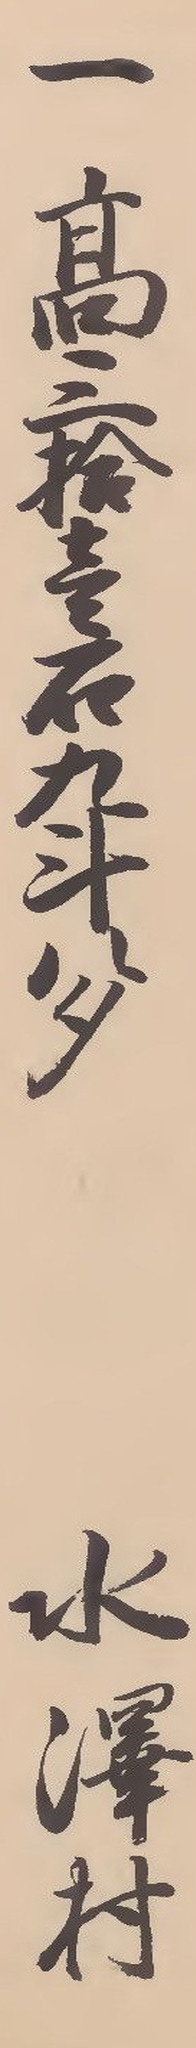一高三拾壱石九斗八勺水沢村
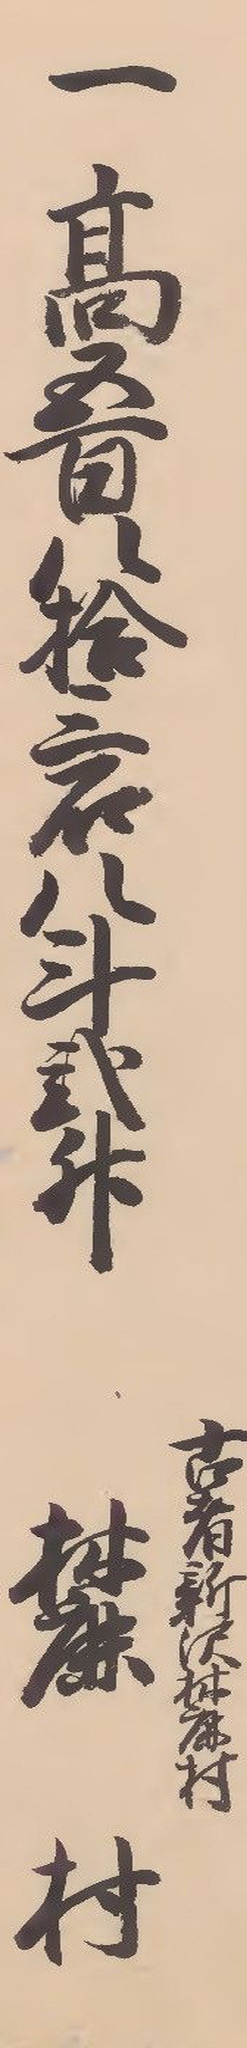一高五百八拾三石八斗弐升麓村
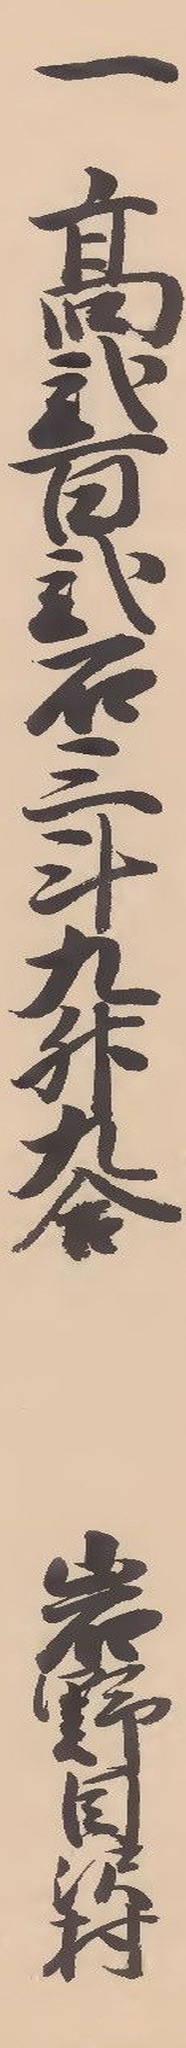一高弐百弐石三斗九升九合岩野目沢村
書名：出羽国郷帳　５
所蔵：国立公文書館 National Archives of Japan
